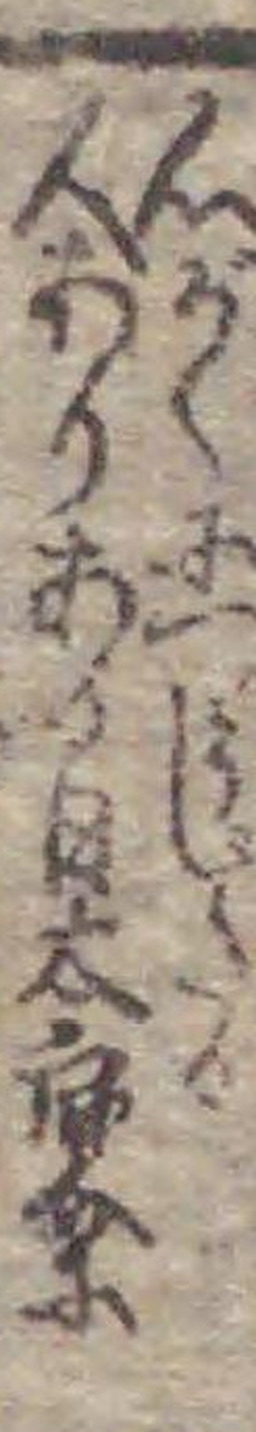人ありある日太郎介に
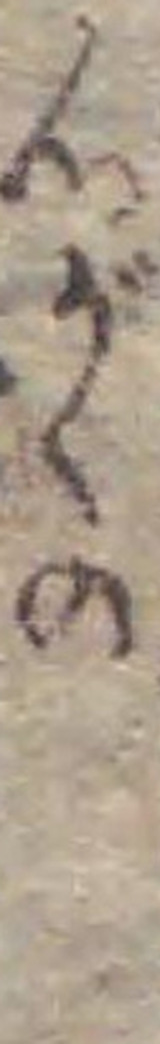心がくの
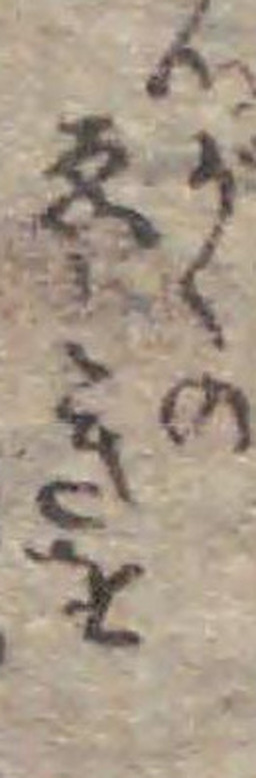ゑときを
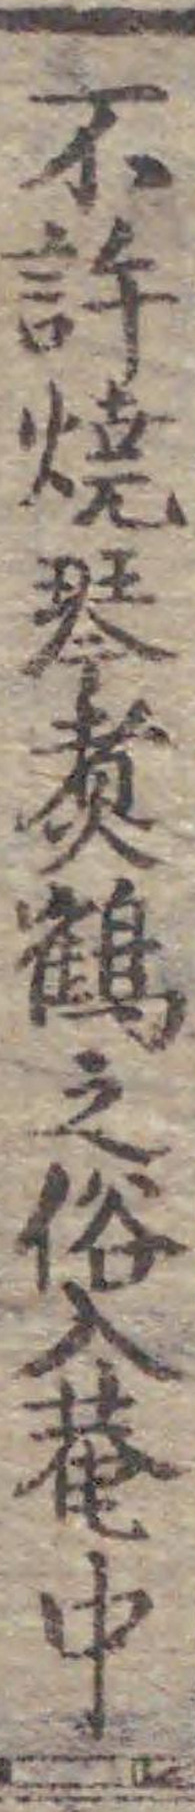不許焼琴煮鶴之俗入菴中
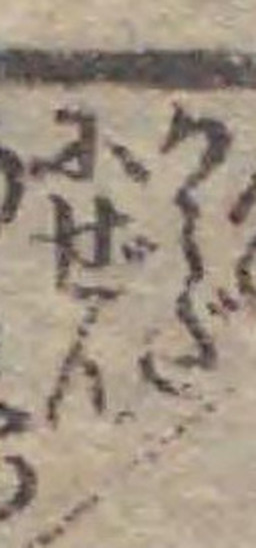にぜん
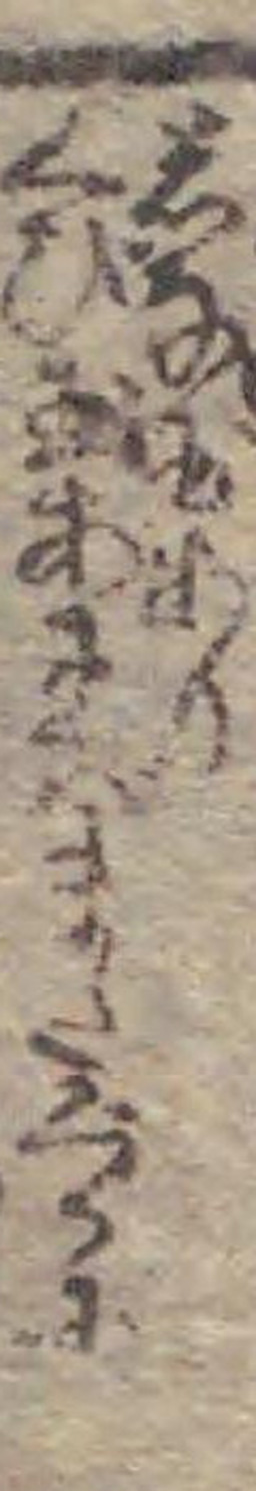くび玉あればまたくらに
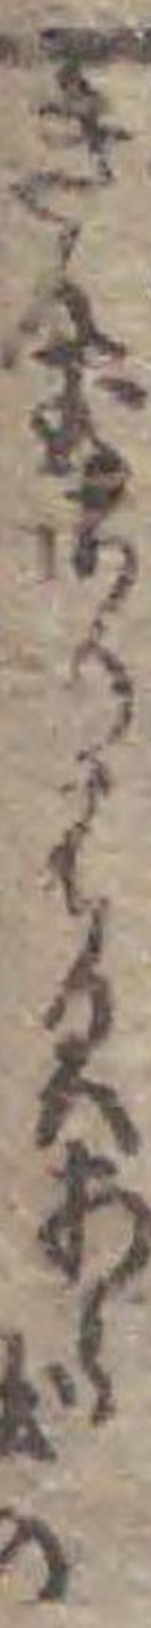きん玉ありはるはあら
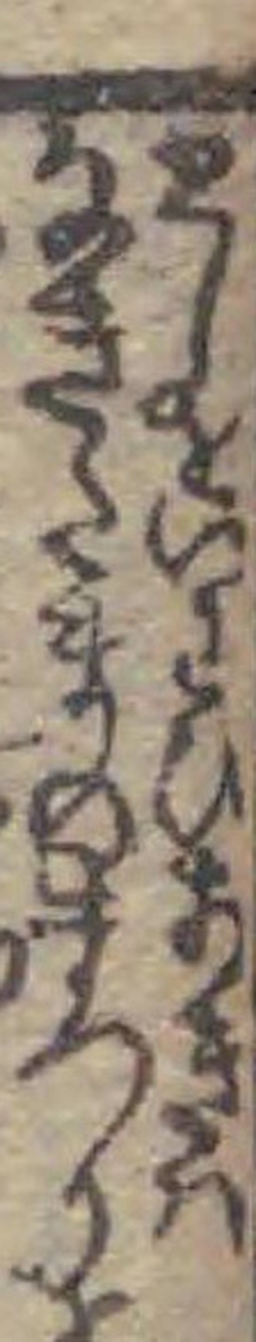なきたまのまつりを
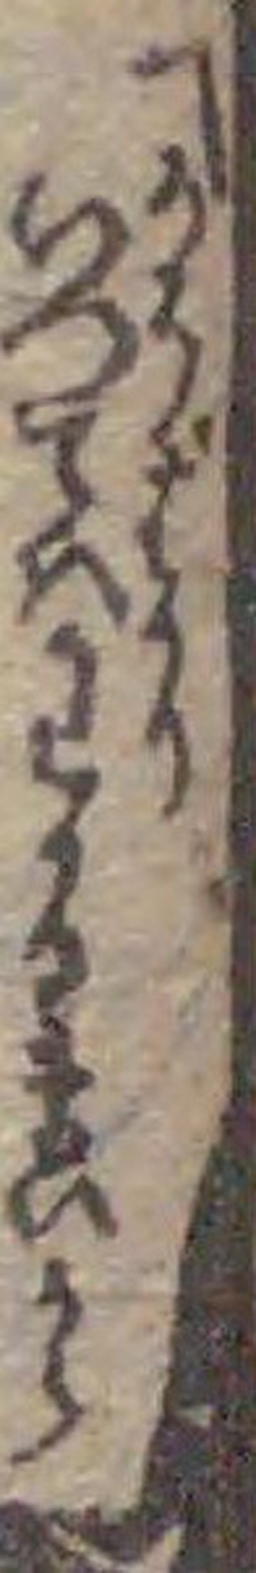いつてはわかるまいから
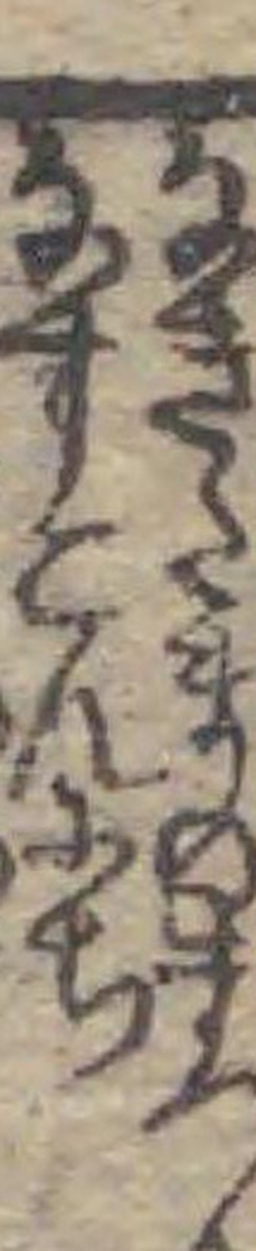なすこんにち
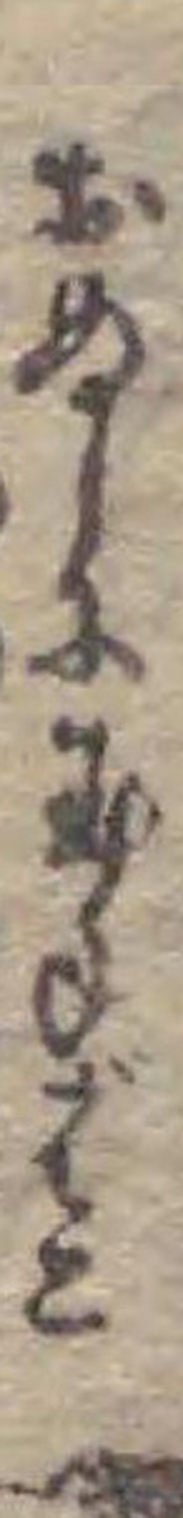おぬしに玉手ばこ
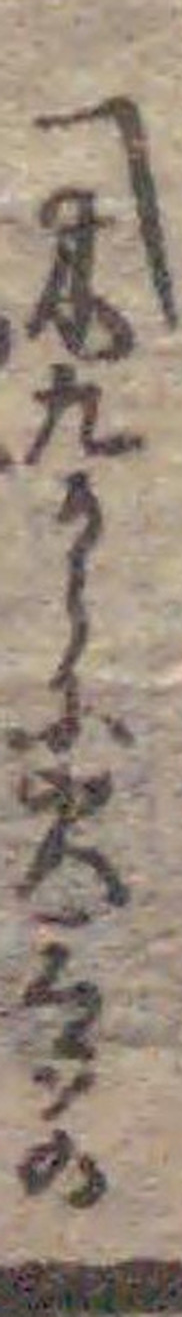〽木九からに火三つの
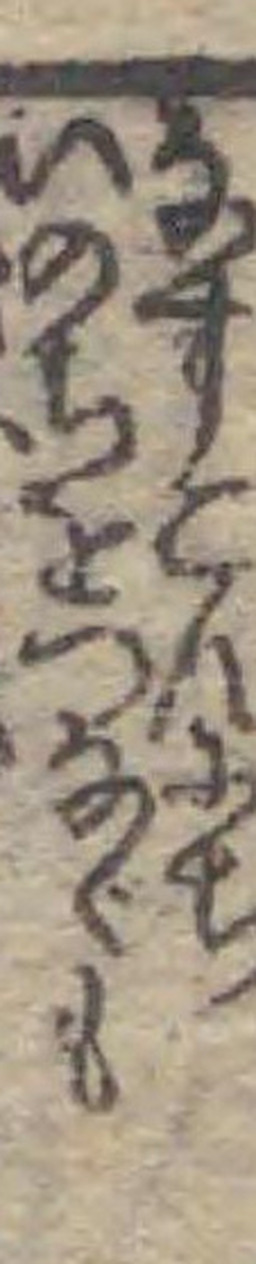いのちをつなぐも
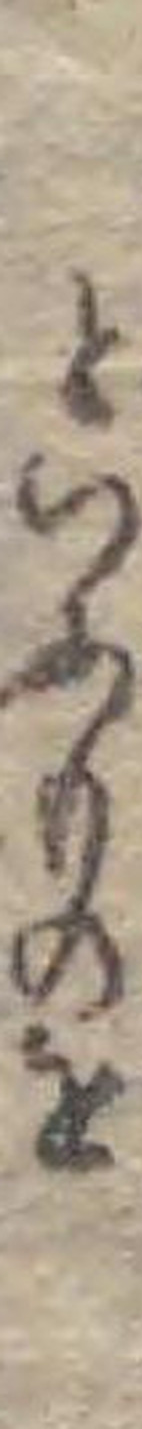といふものを
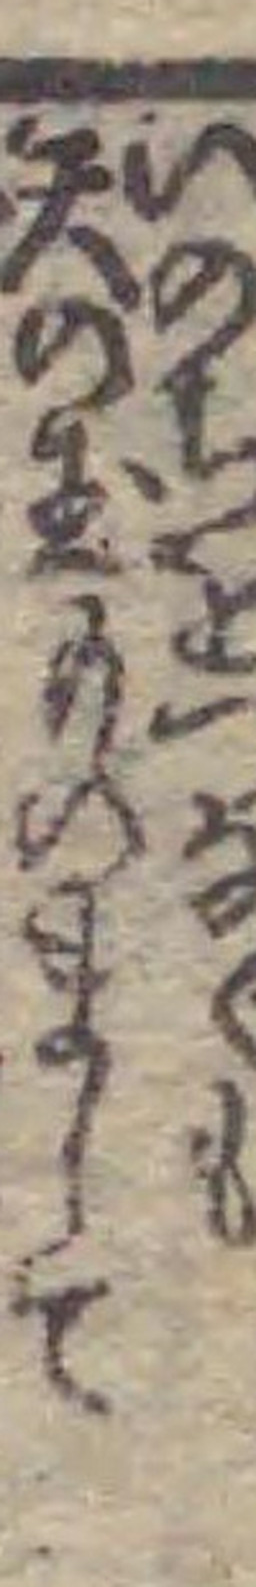天の玉ものまして
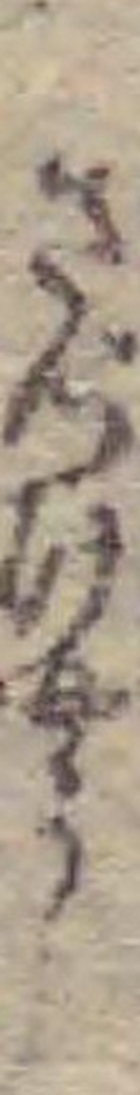さづけやう
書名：四遍搨心学草帋 : 3巻
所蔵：国立国会図書館 National Diet Library, JAPAN
